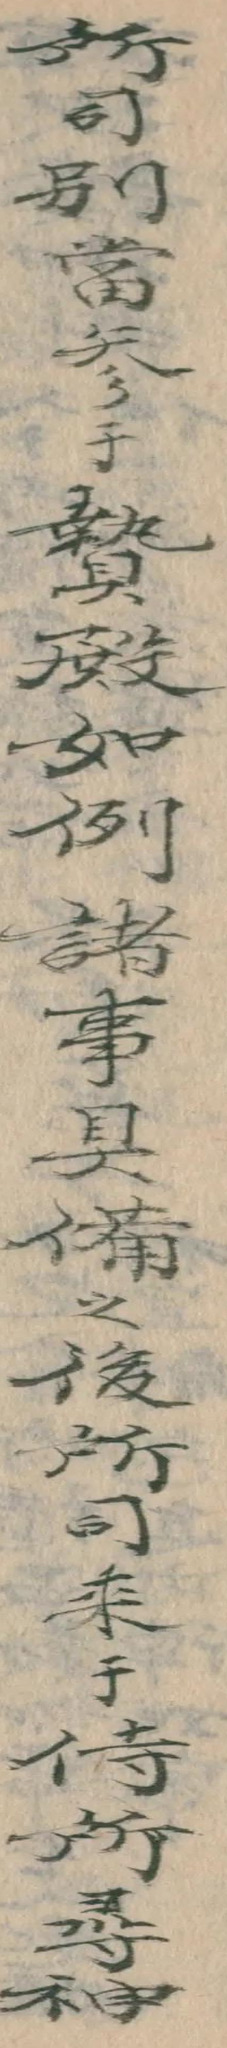所司別当参于贄殿如例諸事具備之後所司来于侍所尋神

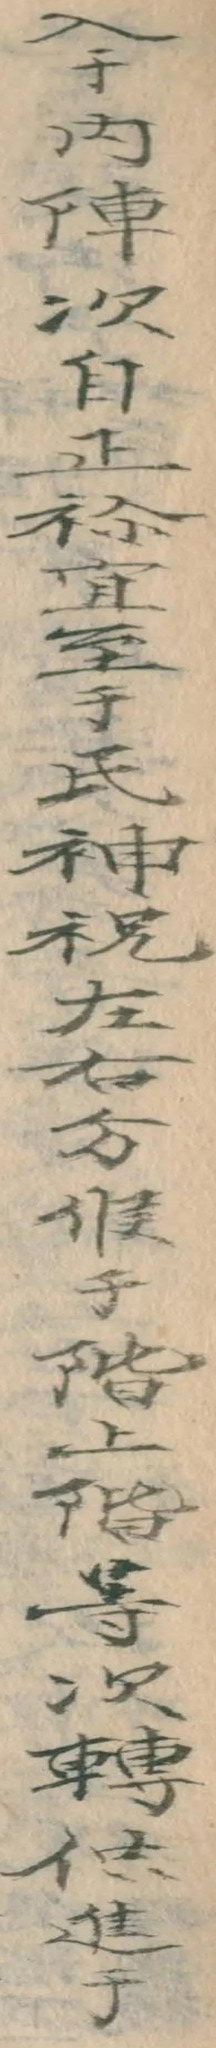入于内陣次自正祢宜至于氏神祝左右分候于階上階等次転供進于
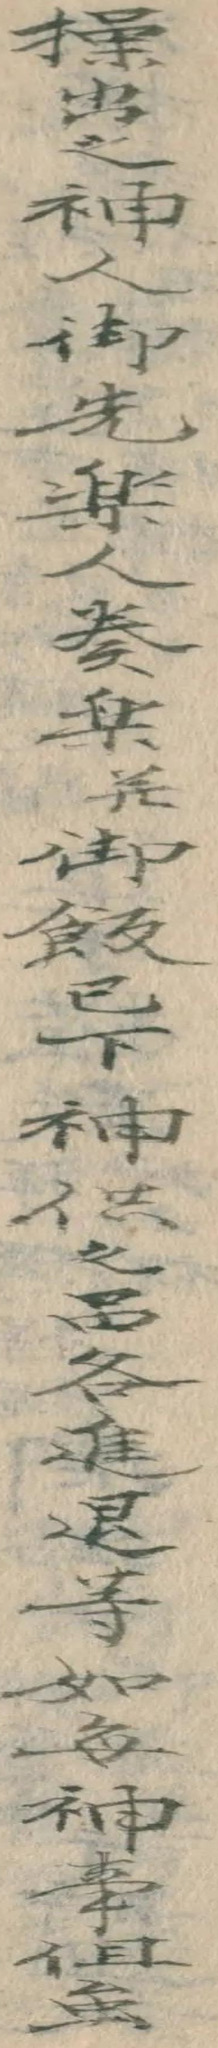操出之神人御先楽人奏楽并御飯已下神供之品各進退等如毎神事但雖
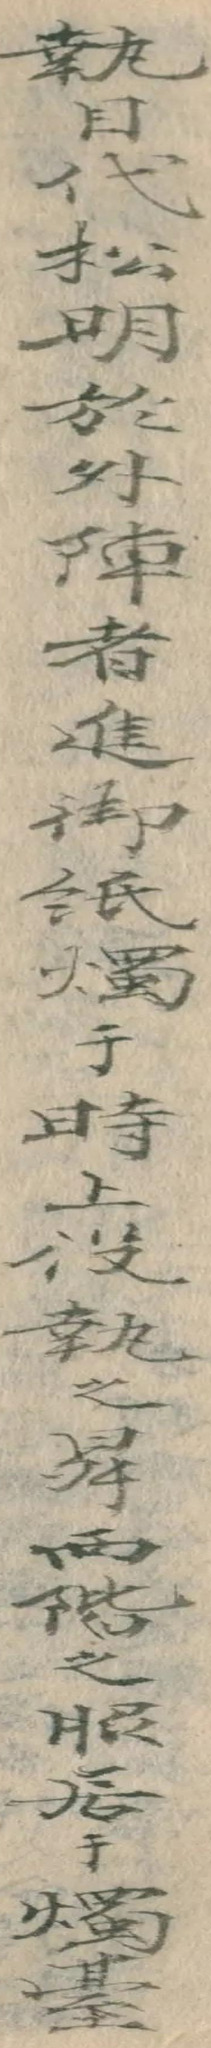執目代松明於外陣者進御紙燭于時上役執之昇西階之脇居于燭台

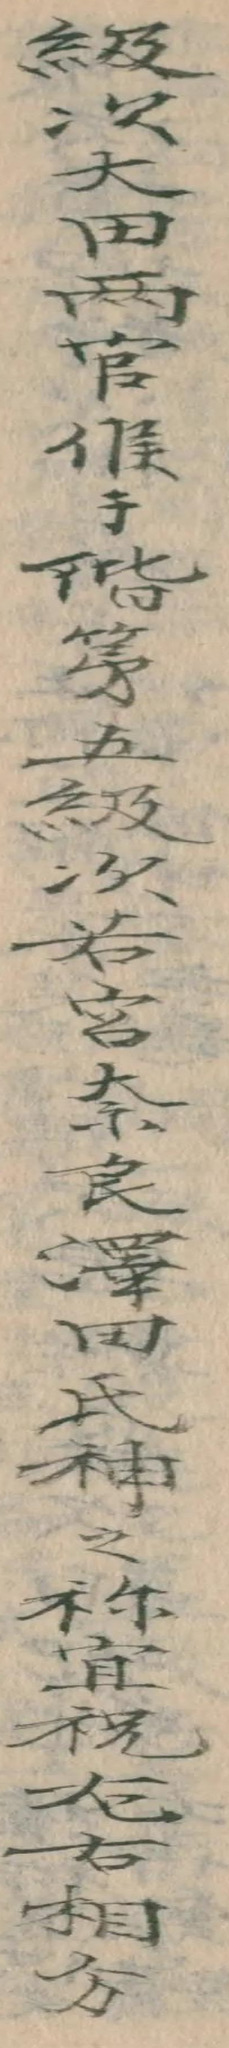級次大田両官候于階第五級次若宮奈良沢田氏神之祢宜祝左右相分

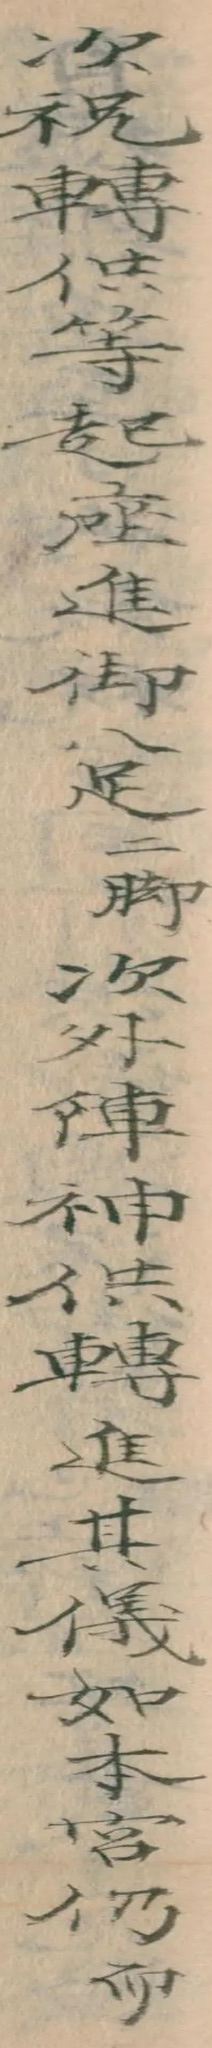次祝転供等起座進御八足二脚次外陣神供転進其儀如本宮仍而
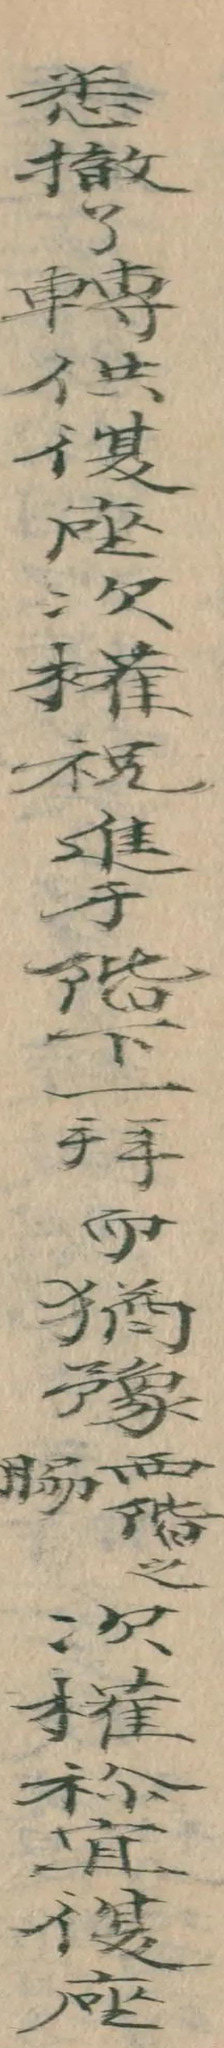悉撤了転供復座次権祝進于階下一拝而猶予西階之脇次権祢宜復座

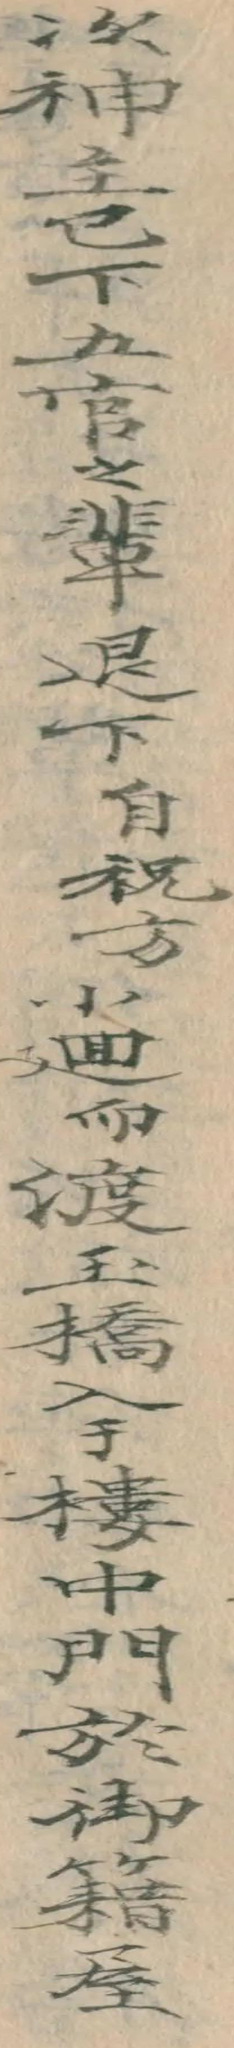次神主已下五官之輩退下自祝方小廻而渡玉橋入于楼中門於御籍屋
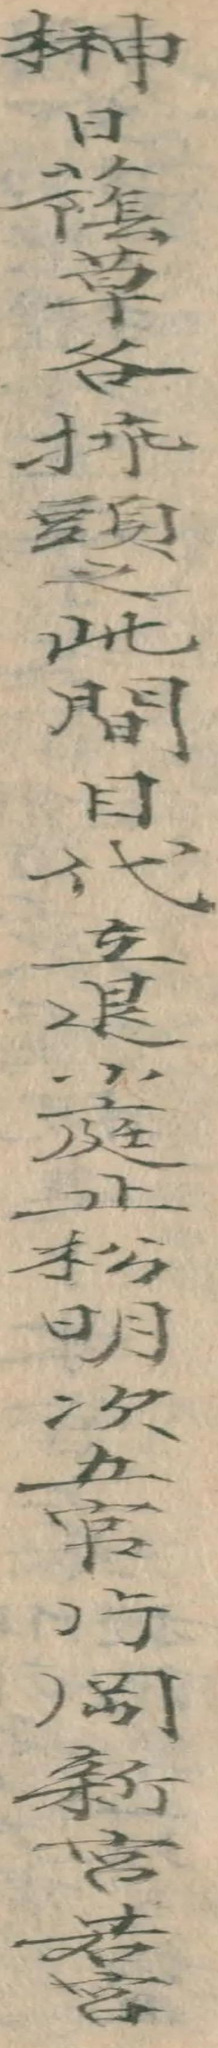榊日蔭草各挿頭之此間目代立退小庭止松明次五官片岡新宮若宮
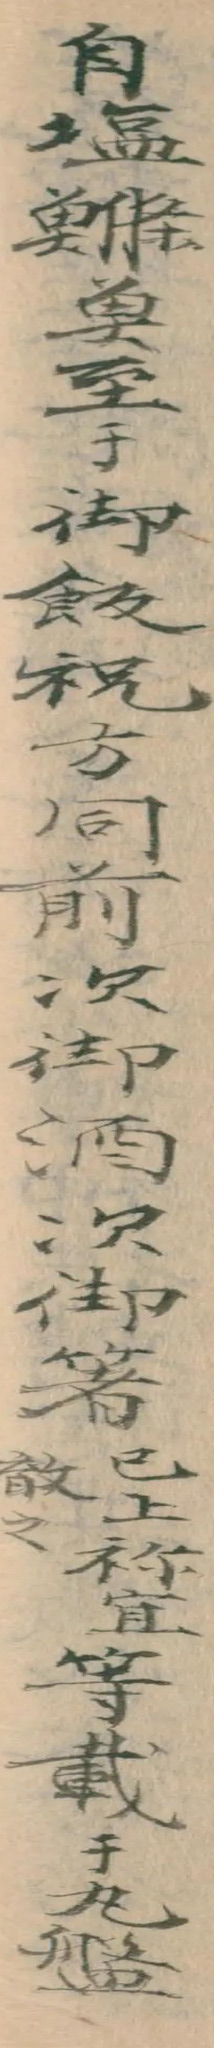自塩鰷魚至于御飯祝方同前次御酒次御箸已上祢宜撤之等載于丸盤
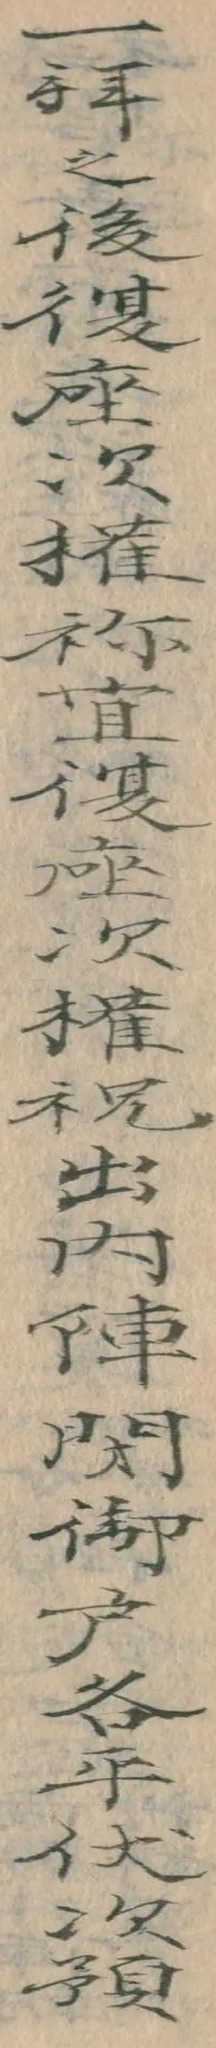一拝之後復座次権祢宜復座次権祝出内陣閉御戸各平伏次預
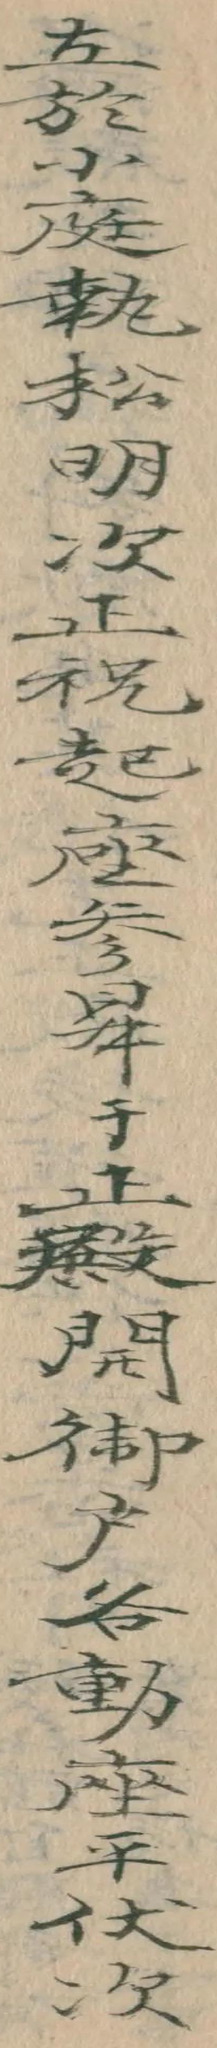立於小庭執松明次正祝起座参昇于正殿開御戸各動座平伏次

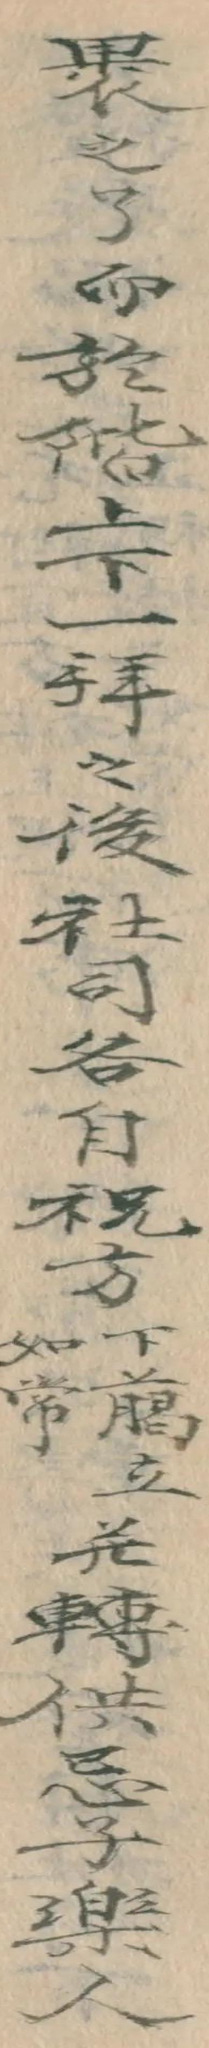褁之了而於階上下一拝之後社司各自祝方下臈立如常并転供忌子楽人

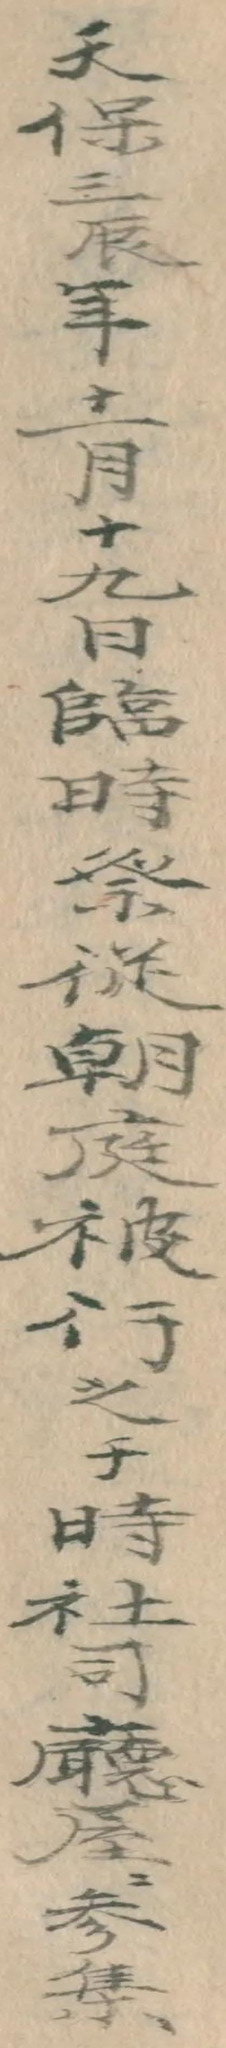天保三辰年十一月十九日臨時祭従朝庭被行之于時社司庁屋ニ参集
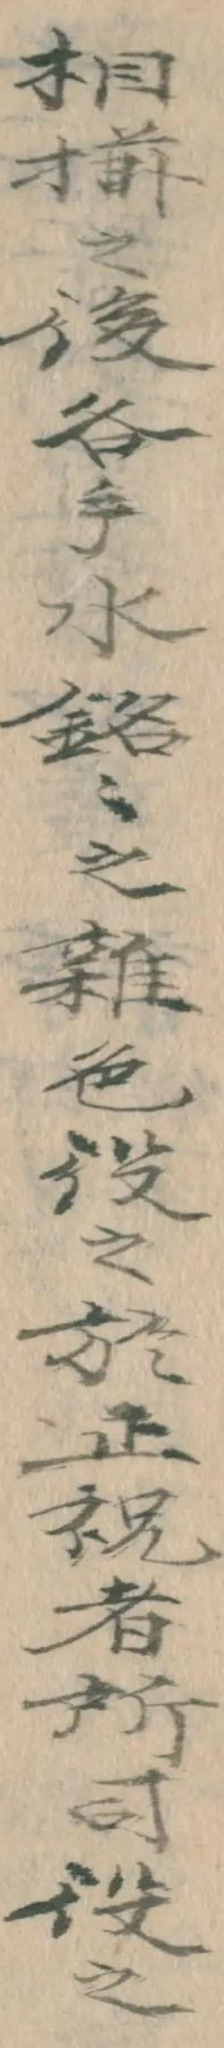相揃之後各手水銘々之雑色役之於正祝者所司役之
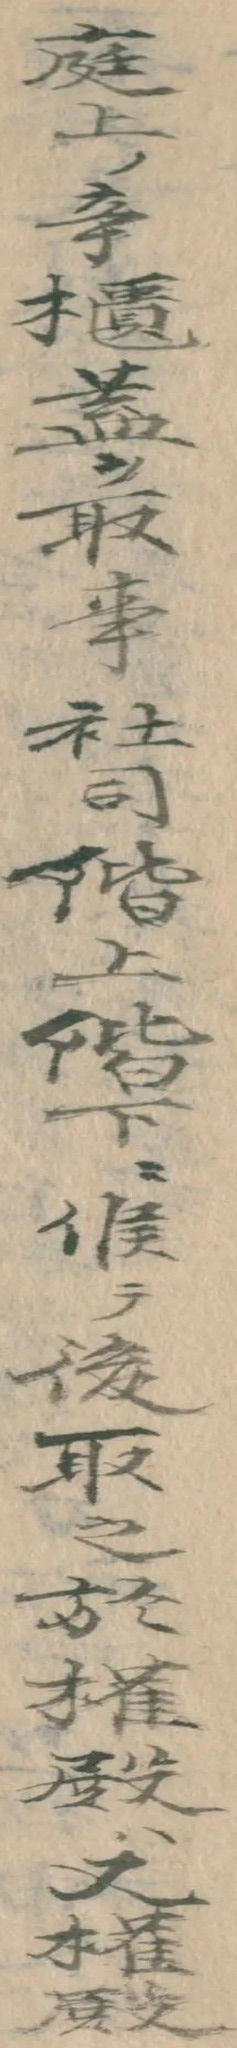庭上ノ辛櫃蓋ヲ取事社司階上階下ニ候テ後取之於権殿ハ又権殿
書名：賀茂社記録. 第9冊
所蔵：国立国会図書館 National Diet Library, JAPAN
